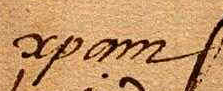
xpam
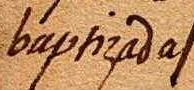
baptizada
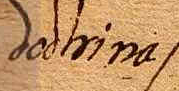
doctrina
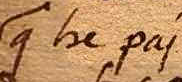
q̄ he paj
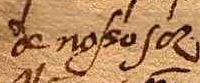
de nosso sor
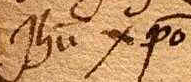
Jhū xpō
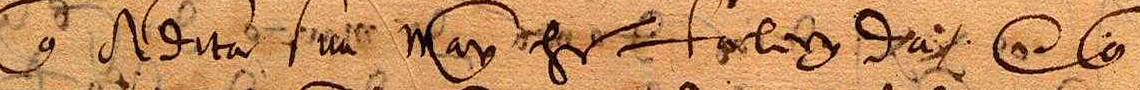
q̄ A d̄ita sua mãy he falecyda ./. e q̄
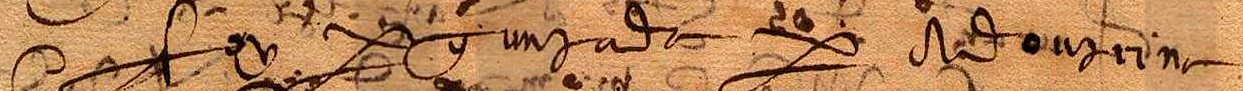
e foy ꝑguntada ꝑ A doutrina
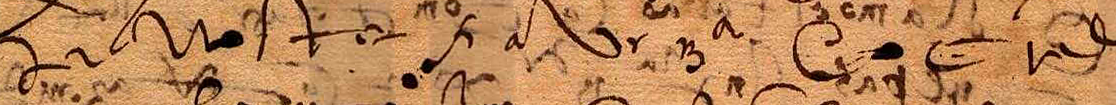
ter Noster e ave ma e o Credo
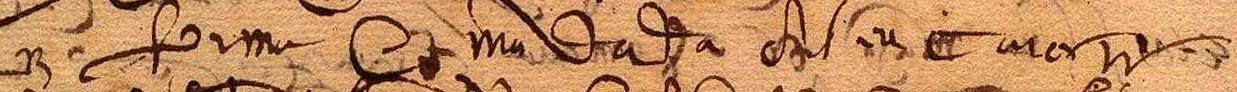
em forma e mādada A seu carcere
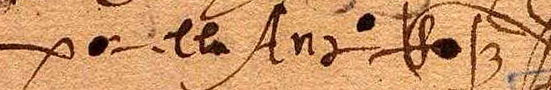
por ella Anto RoJz̄
